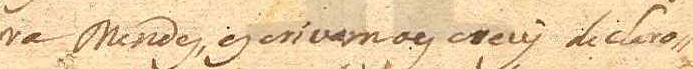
ra Mendes, escrivam o escrevj declaro
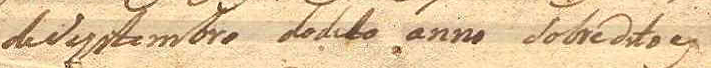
de Septembro do dito anno sobre dito es
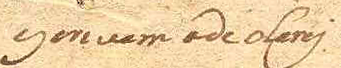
escrevam o declarej
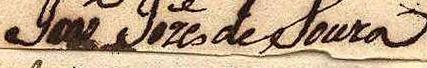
Ioaõ Iozé de Souza
